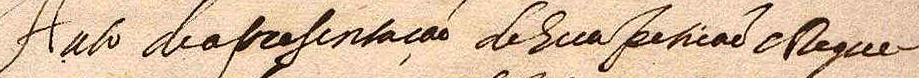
Auto de apresentaçaõ de hua petiçaõ e Reque
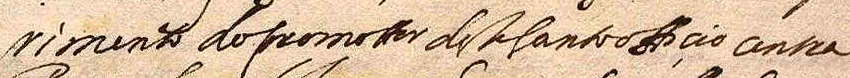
rimento do promottor deste santo officio contra
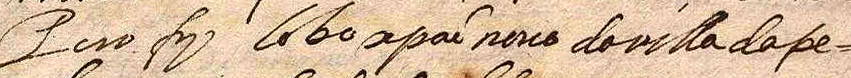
Pero frz̄ lobo xpaõ nouo da villa da pe
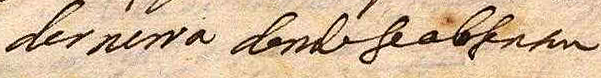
derneira donde se absentou
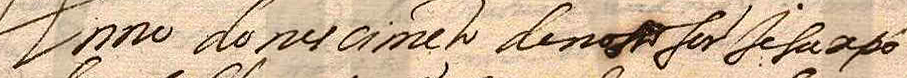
Anno do nascimēto de nosso sor̄ Jesu xpō
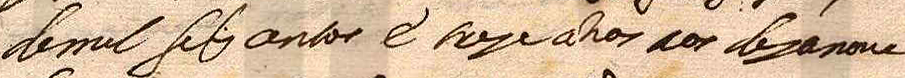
de mil seiscentos e treze an̄os aos dezanoue
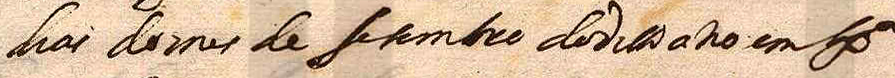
dias do mes de setembro do ditto ano em lxa
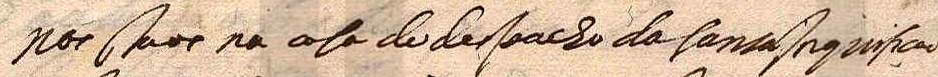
nos staos na casa de despacho da santa Jnquisiçaõ
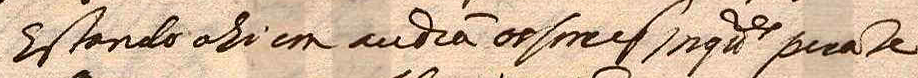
Estando ahi em audiā os snres̄ jnqures perāte
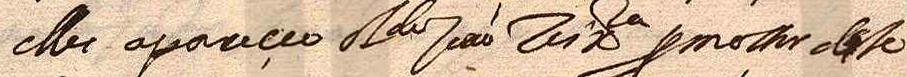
elles apareceo o Ldo Joaõ Teixra ꝓmottor deste
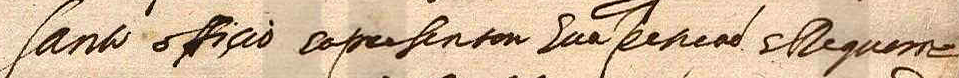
Santo officio E apresentou hua petiçaõ E Requeri
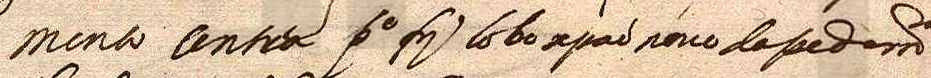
mento contra po frz̄ lobo xpaõ nouo da pedernra
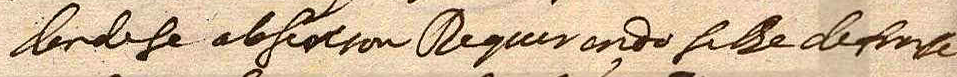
donde se absentou Requerendo se lhe deferisse
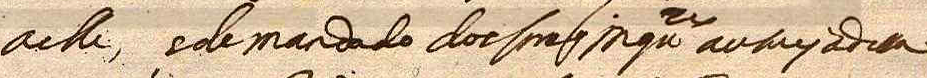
a elle, E de mandado dos sres̄ jnqures autuej a ditta
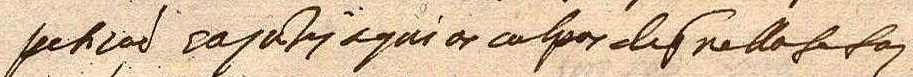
petiçaõ E ajūtei aqui as culpas de q̄ nella se faz
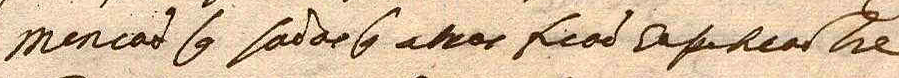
mençaõ q̄ saõ as q̄ atras ficaõ E a petiçaõ he
